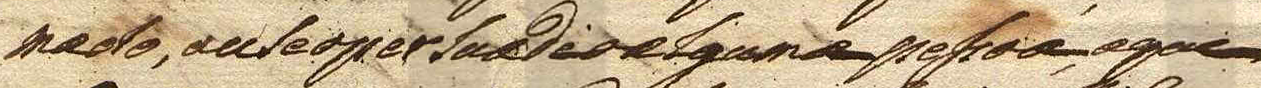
mado, ou se o persuadio alguma pessoa, a que
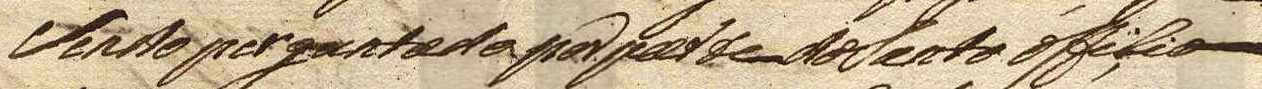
sendo perguntado por parte do Santo offiÇio
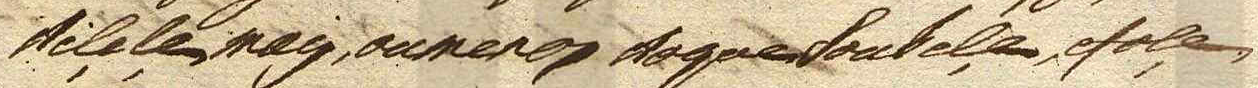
diÇeÇe mais, ou menos do que SoubeÇe, e foÇe
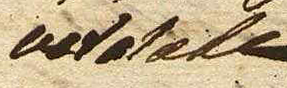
verdade
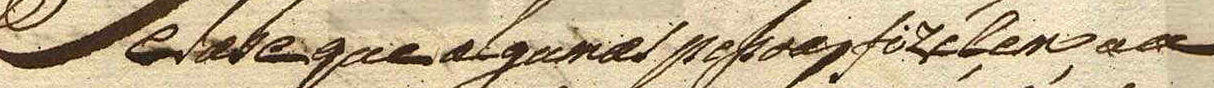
Se sabe que algumas pessoas fizéÇem, ou
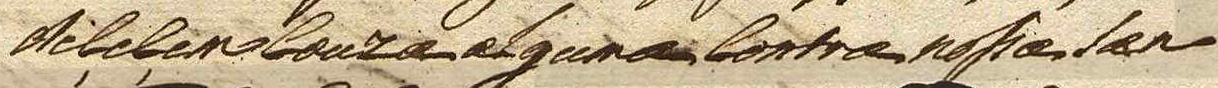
diÇeÇem Couza alguma Contra nossa san
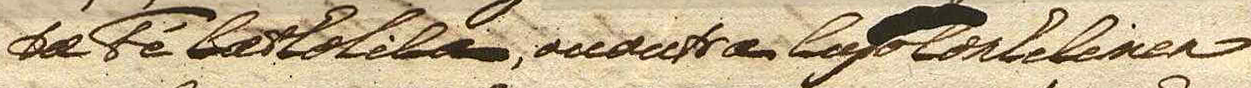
ta Fé CathoLiCa, ou outra Cujo ConheÇimen
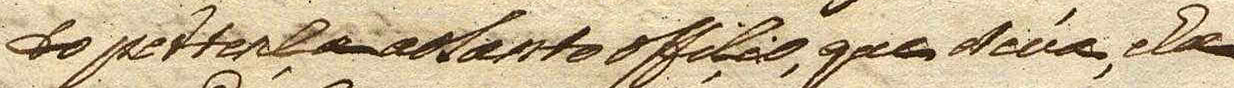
to pertenÇa ao Santo offiÇio, que deva, e ha
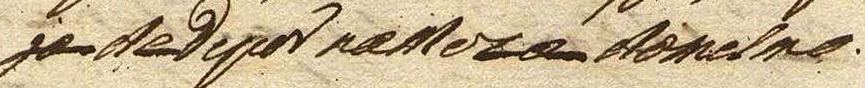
ja de depor na Meza do mesmo.
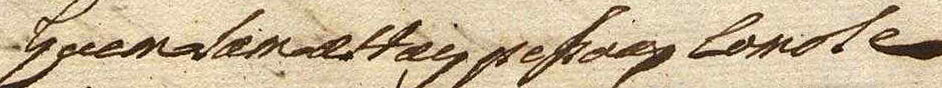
Quem sam as tais pessoas Como se
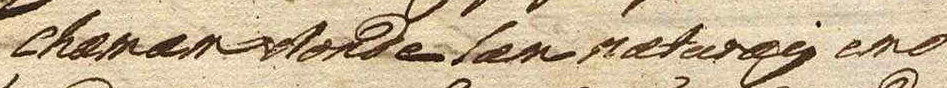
çhamam donde sam naturais e mo
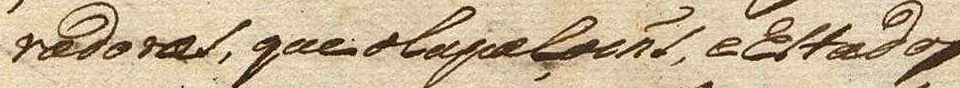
radoras, que oCupaÇoen̄s, e Estados
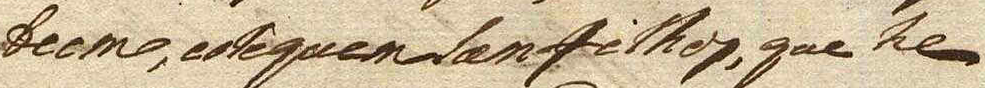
teem, e de quem sam filhos, que he
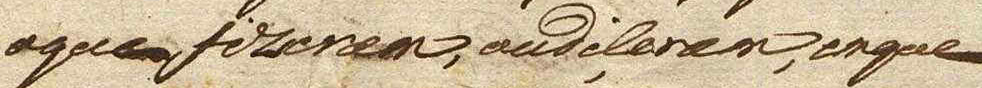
o que fizeram, ou diÇeram, em que
